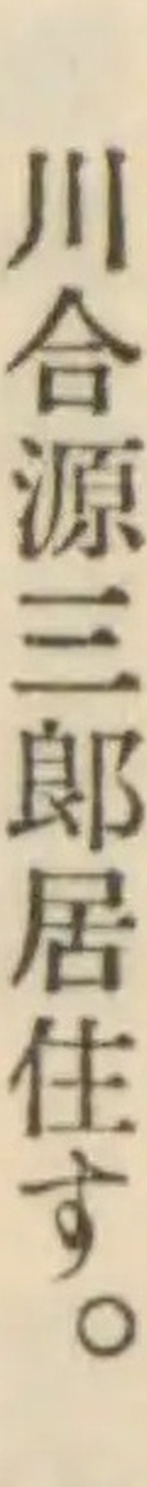川合源三郎居住す。
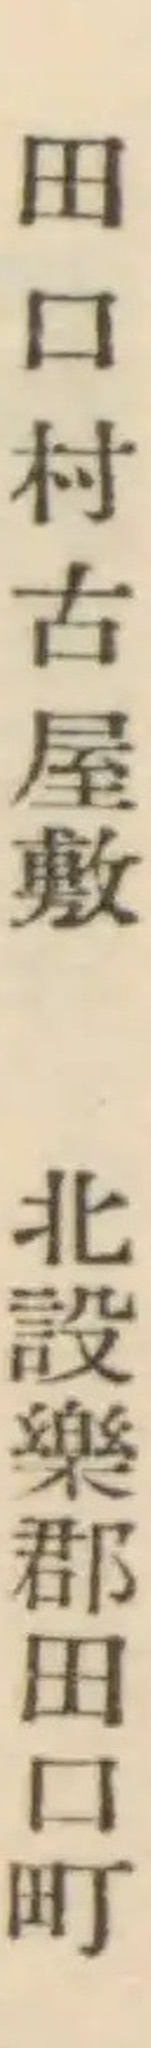田口村古屋敷北設楽郡田口町
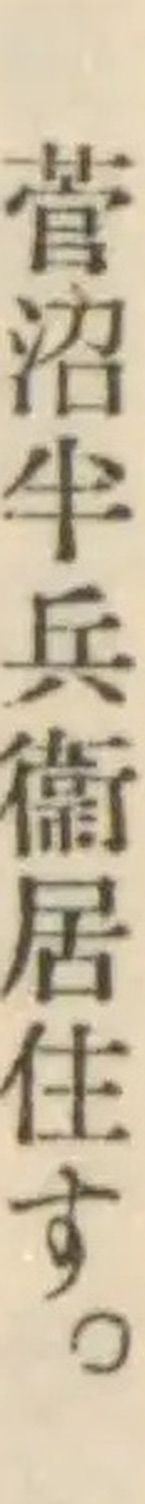菅沼半兵衛居住す。
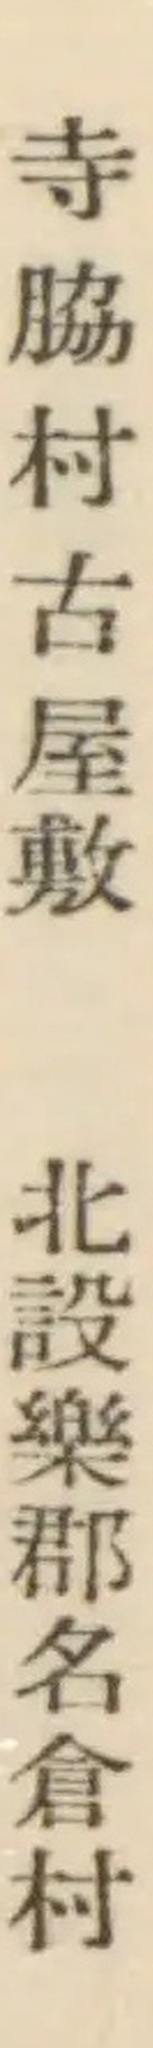寺脇村古屋敷北設楽郡名倉村
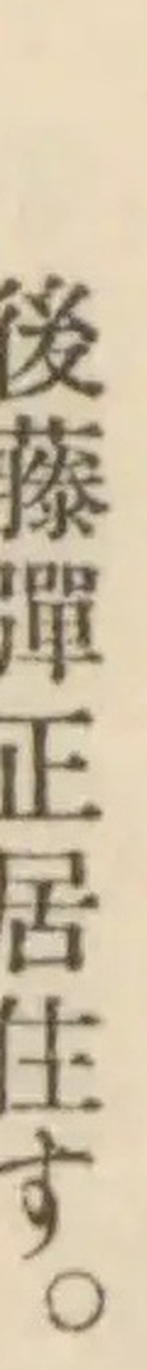後藤弾正居住す。
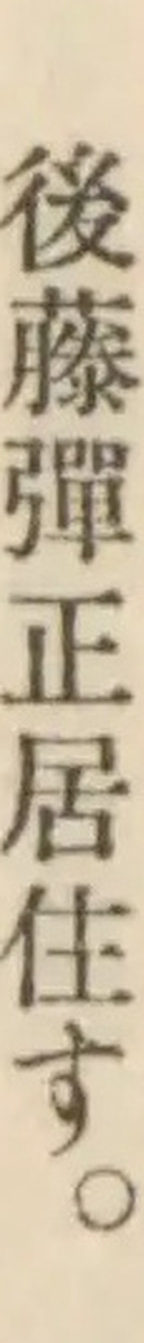後藤弾正居住す。
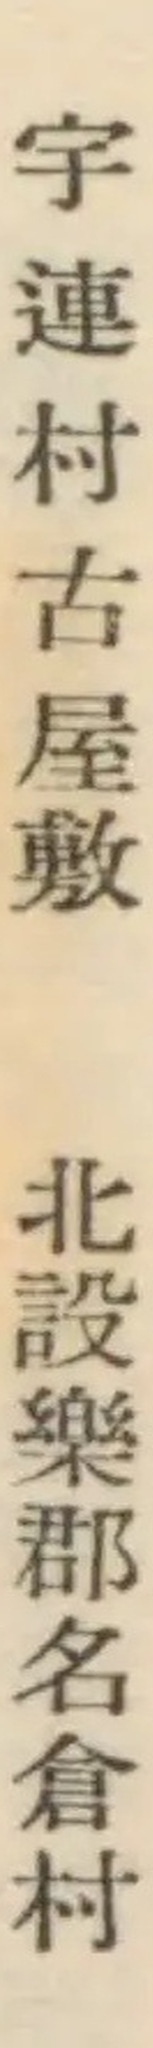宇連村古屋敷北設楽郡名倉村
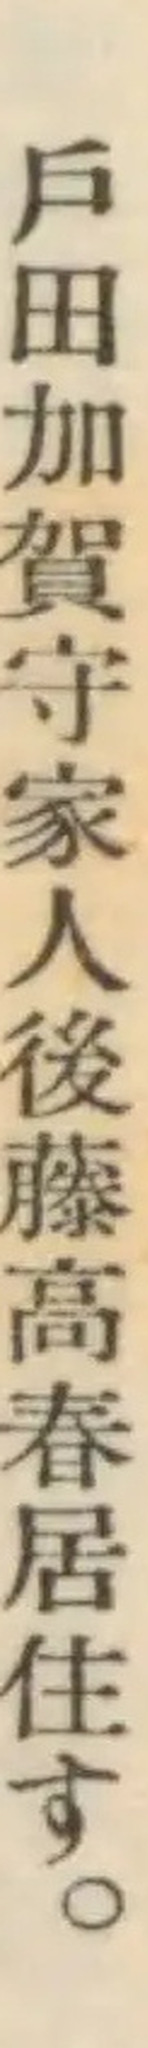戸田加賀守家人後藤高春居住す。
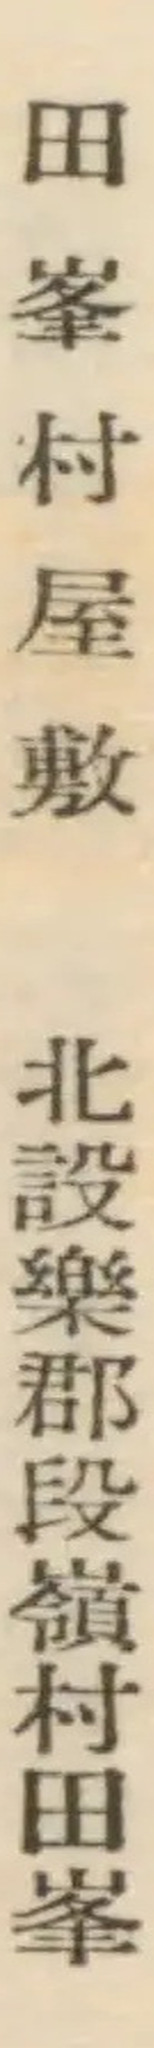田峯村屋敷北設楽郡段嶺村田峯
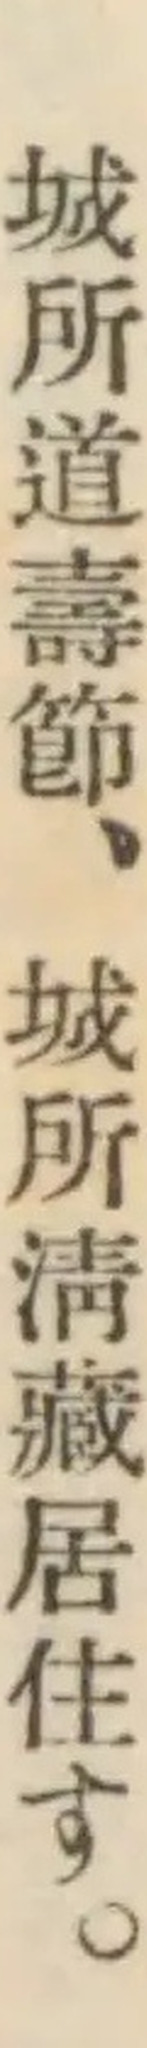城所通壽節、城所清蔵居住す。
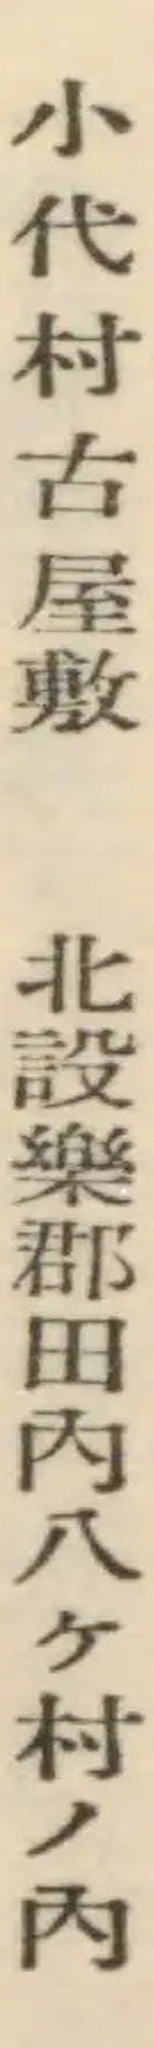小代村古屋敷北設楽郡田内八ケ村ノ内
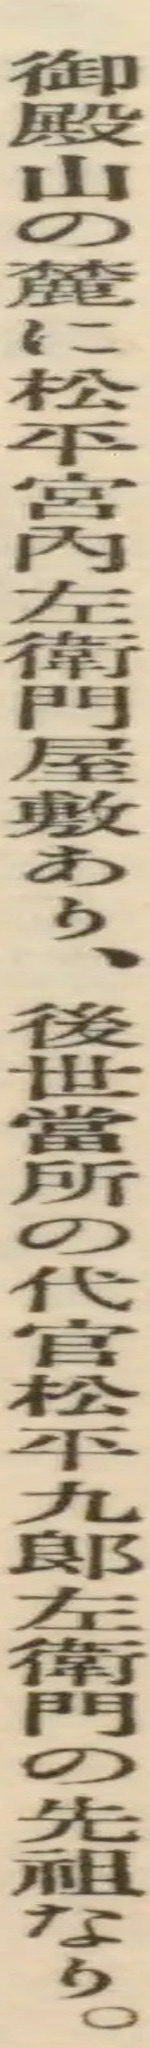御殿山の麓に松平宮内左衛門屋敷あり、後世当所の代官松平九郎左衛門の先祖なり。
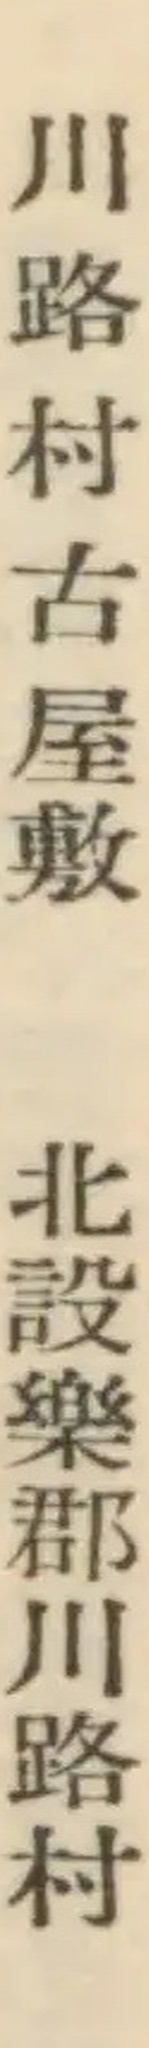川路村古屋敷北設楽郡川路村
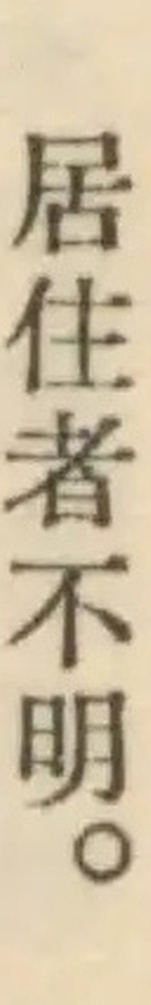居住者不明。
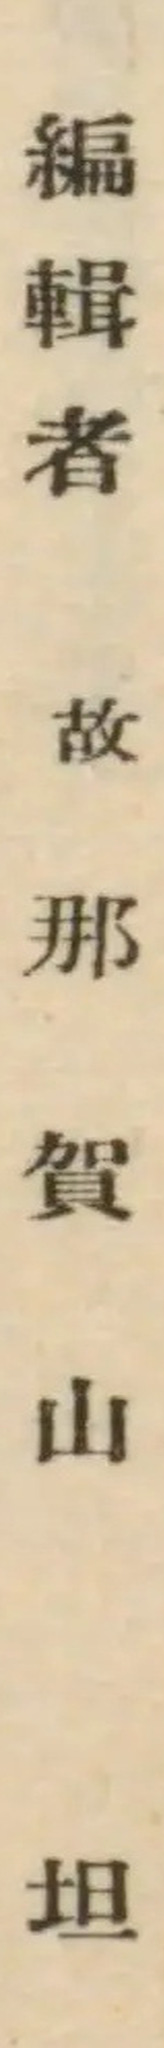編輯者故那賀山坦
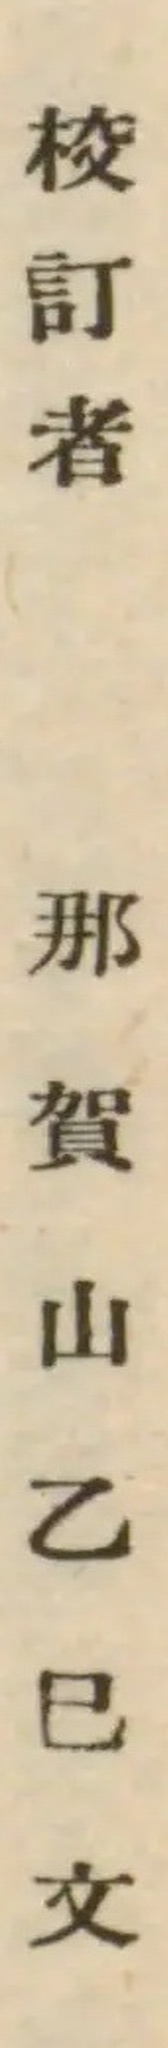校訂者那賀山乙巳文
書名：東三河之古城
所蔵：国立国会図書館 National Diet Library, JAPAN
